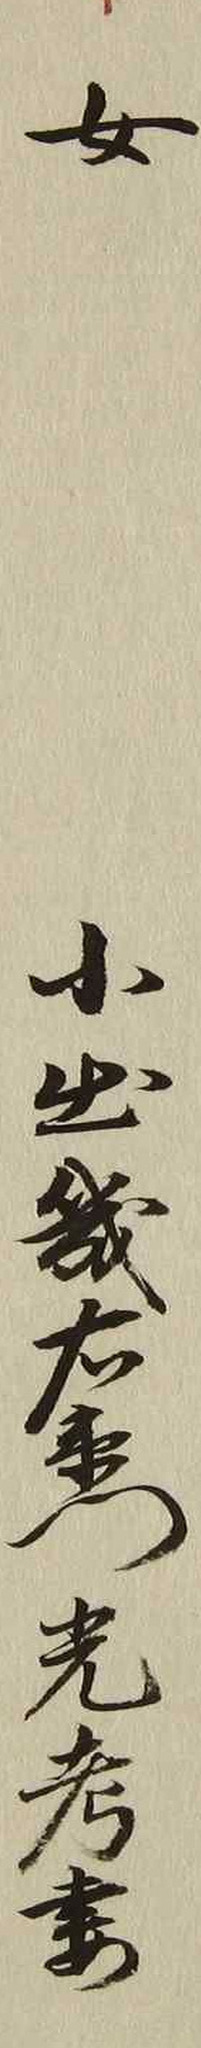女小出幾右衛門光考妻
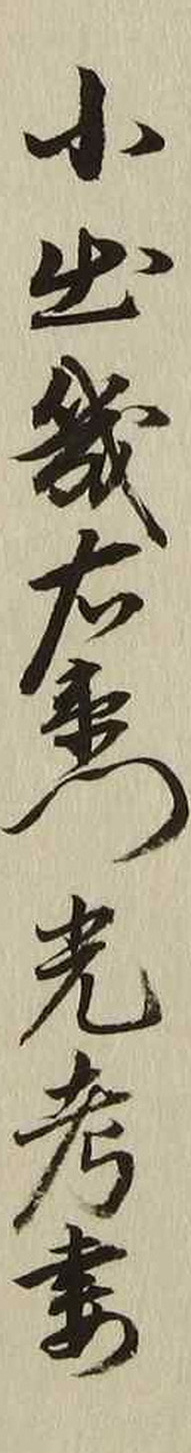女小出幾右衛門光考妻
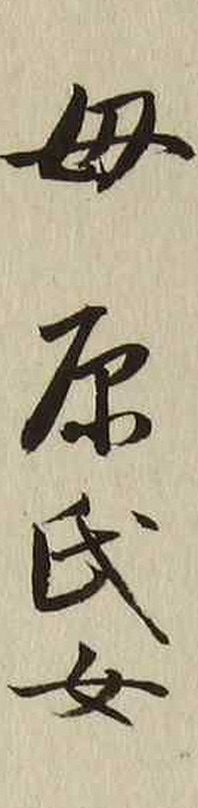母原氏女
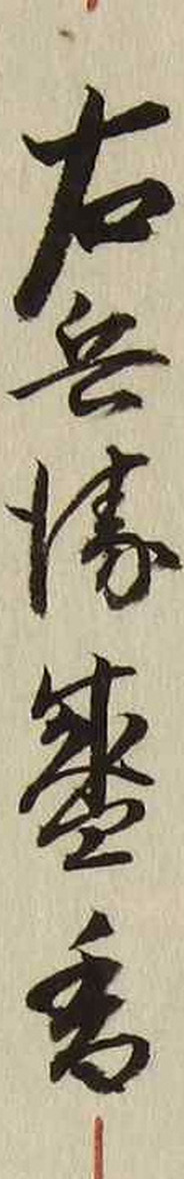右兵衛盛香
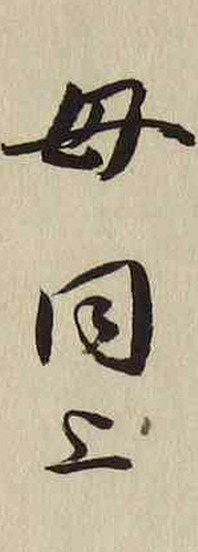母同上

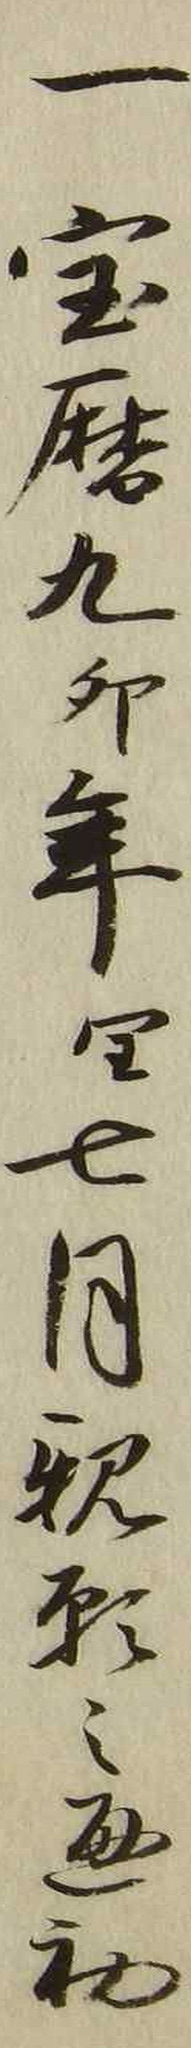一宝暦九卯年閏七月親願之通初
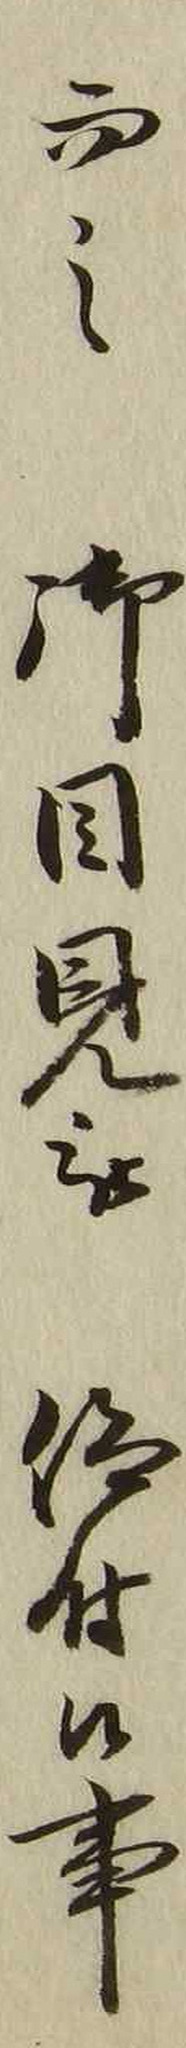而之御目見被仰付候事
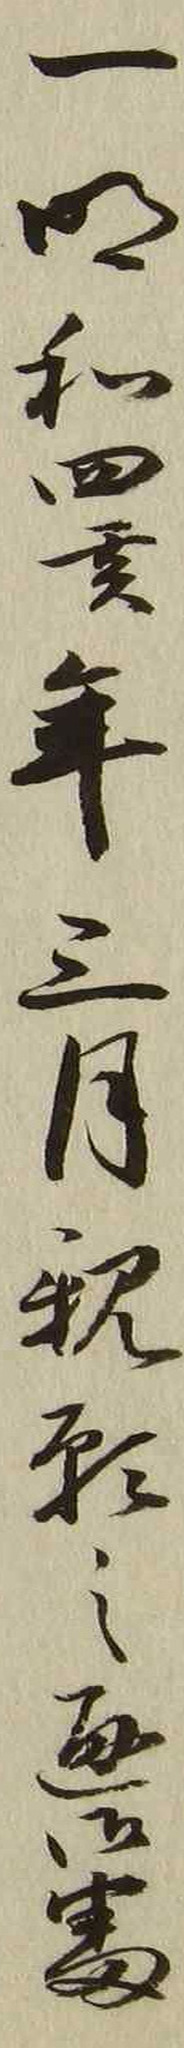一明和四亥年三月親願之通御番
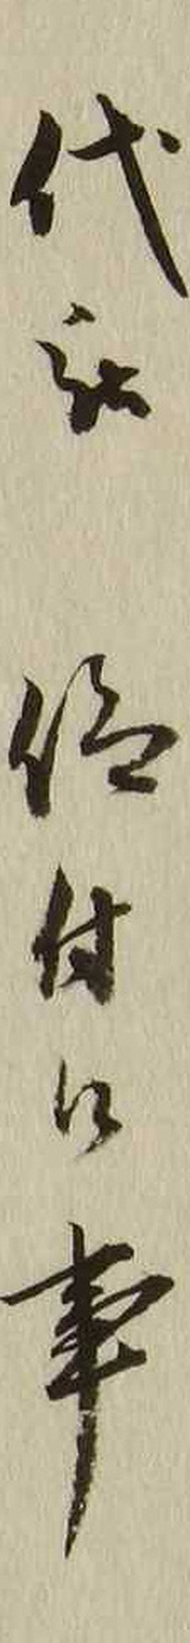代被仰付候事
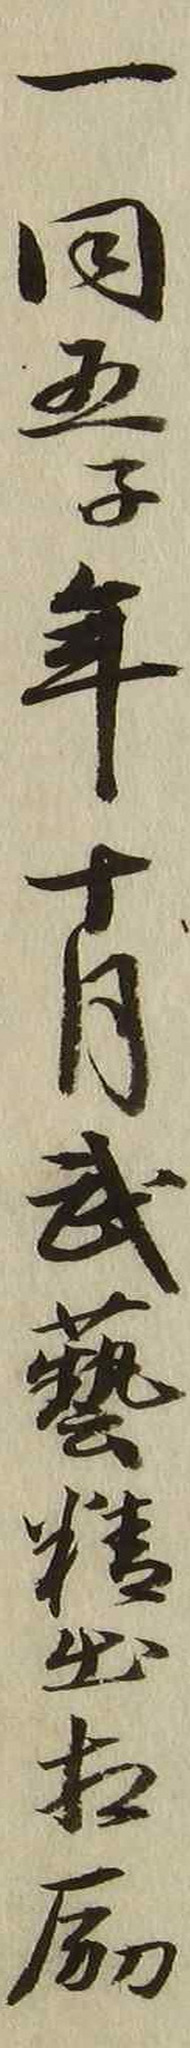一同五子年十月武芸精出相励
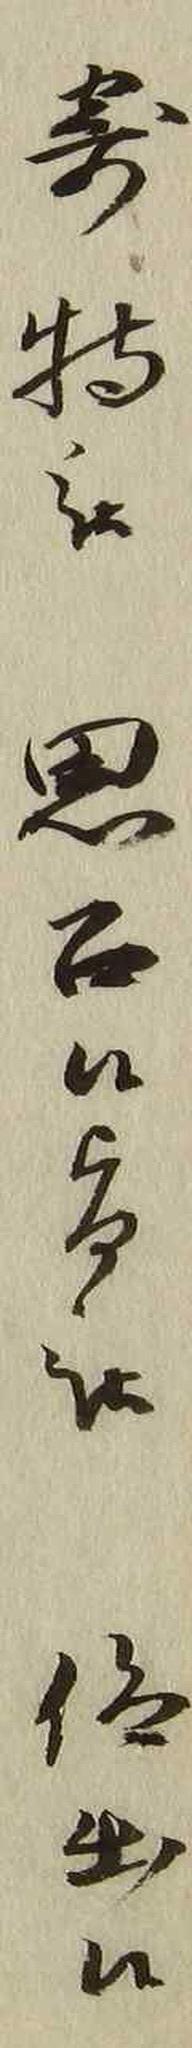寄特被思召候旨被仰出候
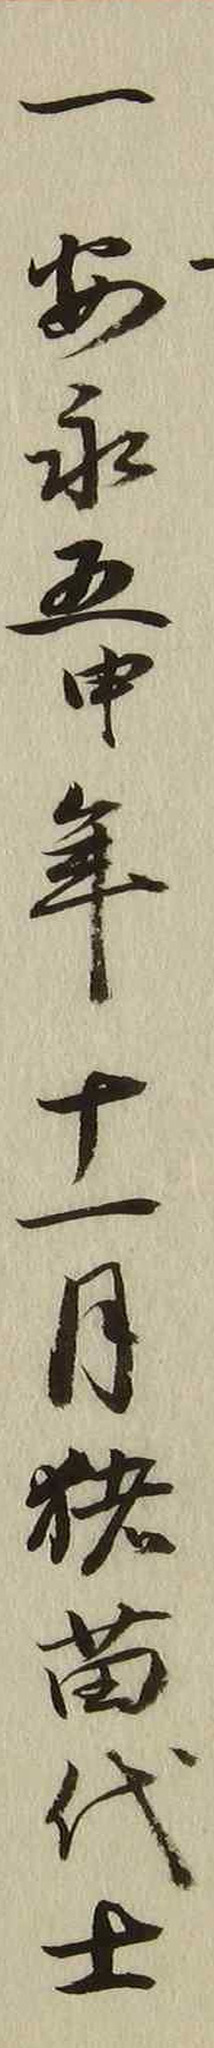一安永五申年十一月猪苗代士
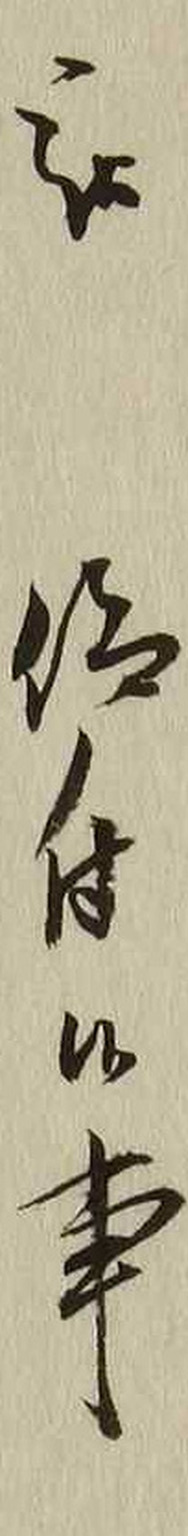被仰付候事
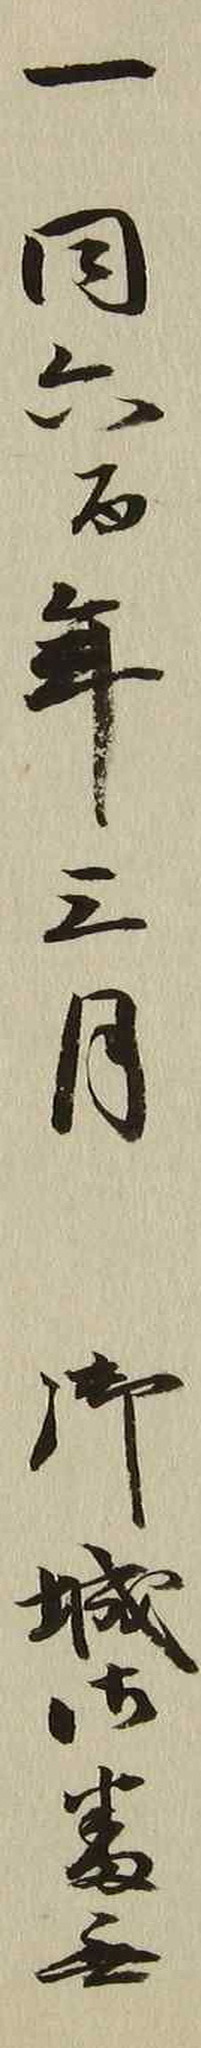一同六酉年三月御城御番無
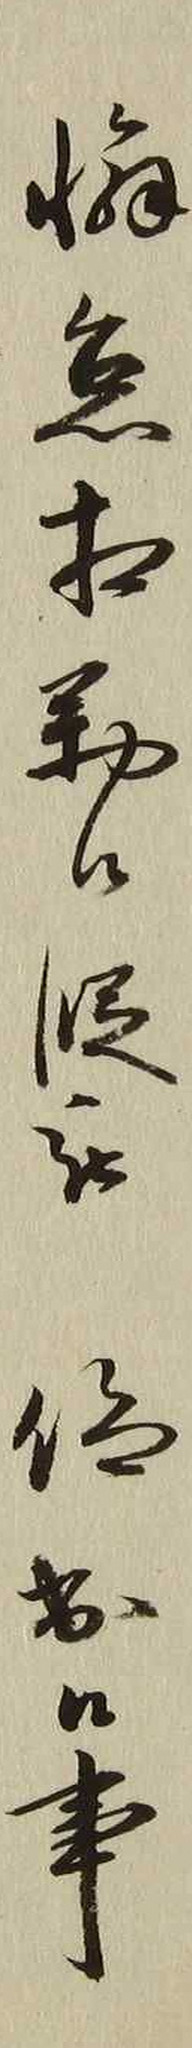懈怠相勤候段被仰出候事
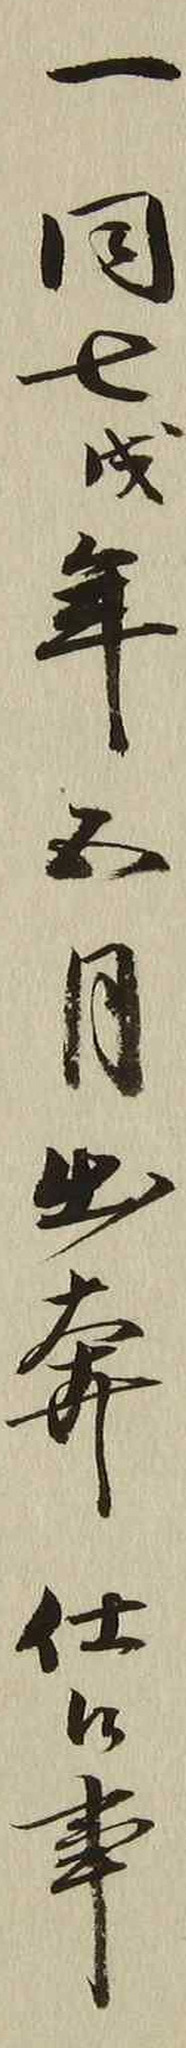一同七戌年五月出奔仕候事
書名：諸士系譜　巻之61　と之部4
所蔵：会津若松市立会津図書館
